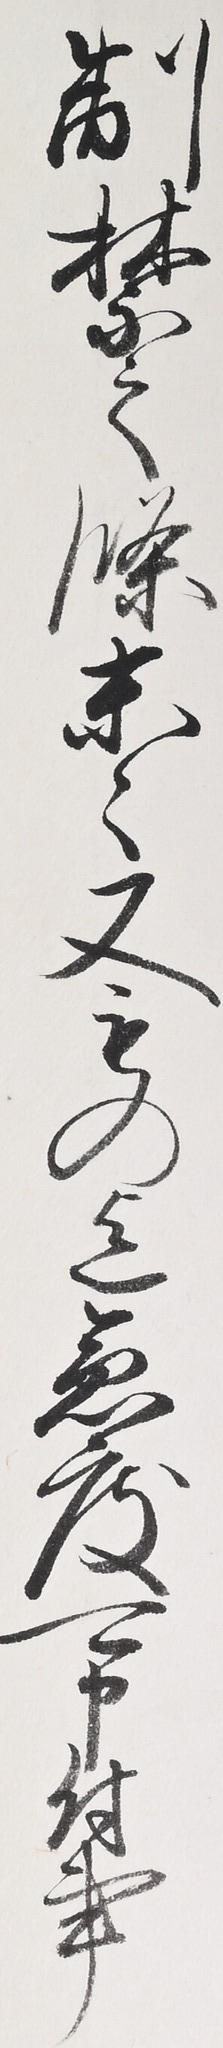制禁之條末々又もの迄急度可申付事
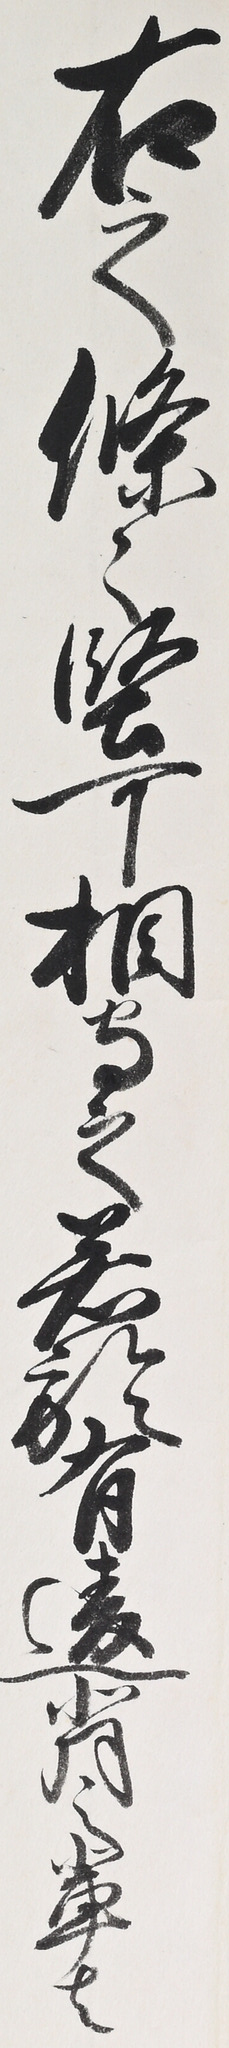右之條々堅可相守之若於有違背之輩者
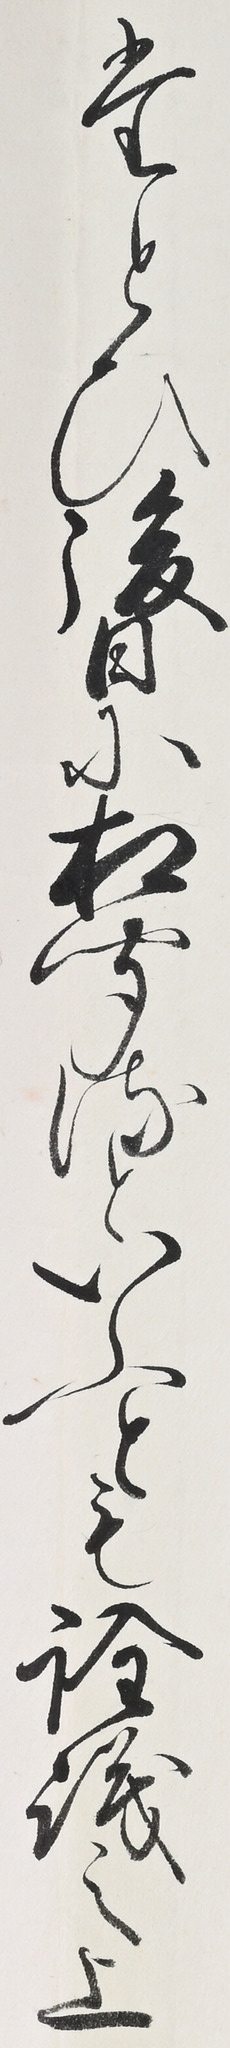たとひ後日に相聞るといふとも詮議之上
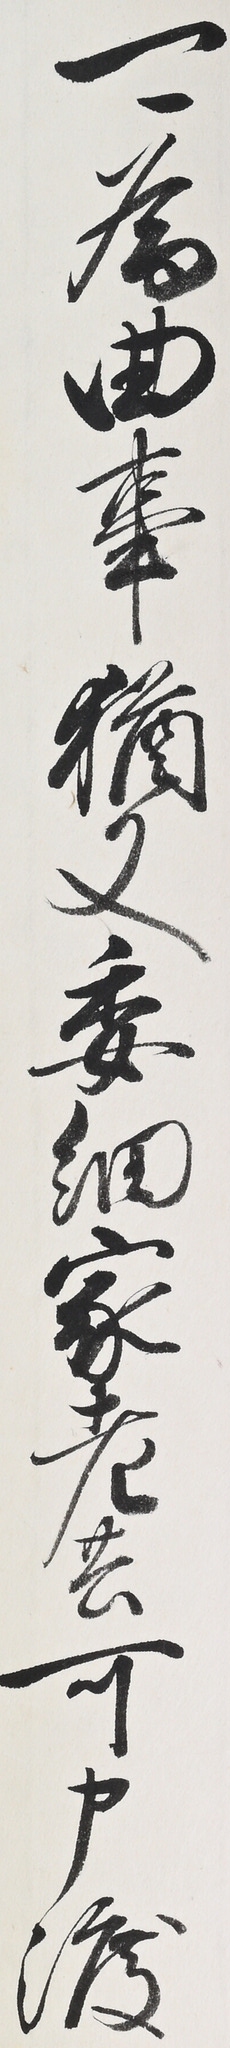可為曲事猶又委細家老共可申渡
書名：大阪道中法度
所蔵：伊那市立高遠町図書館・合同会社AMANE
